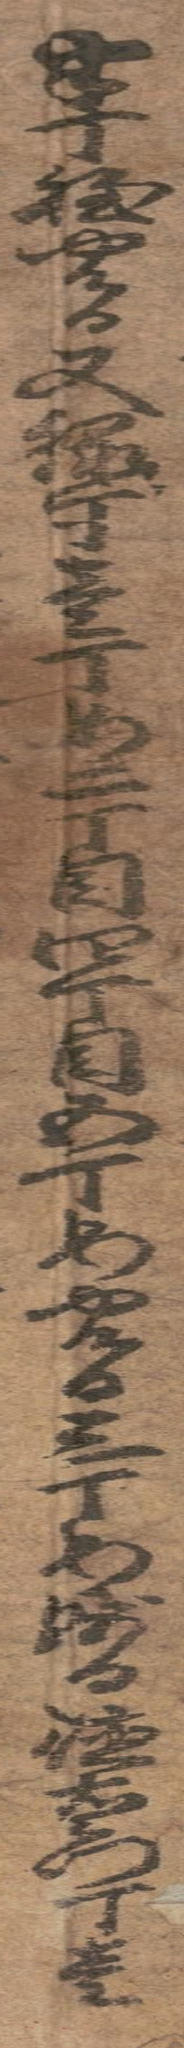半丁程やける又緑丁壱丁め二丁目四丁目五丁めやける三丁め残る徳右衛門丁壱
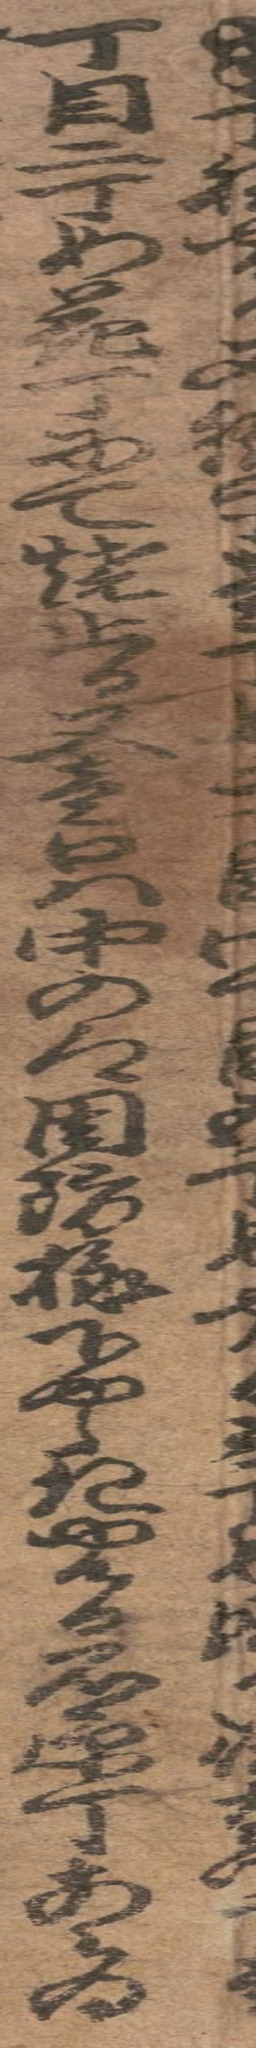丁目弐丁め花丁にて焼止る又壱口ハ中の郷周防様下やしきやける石原丁あらゐ
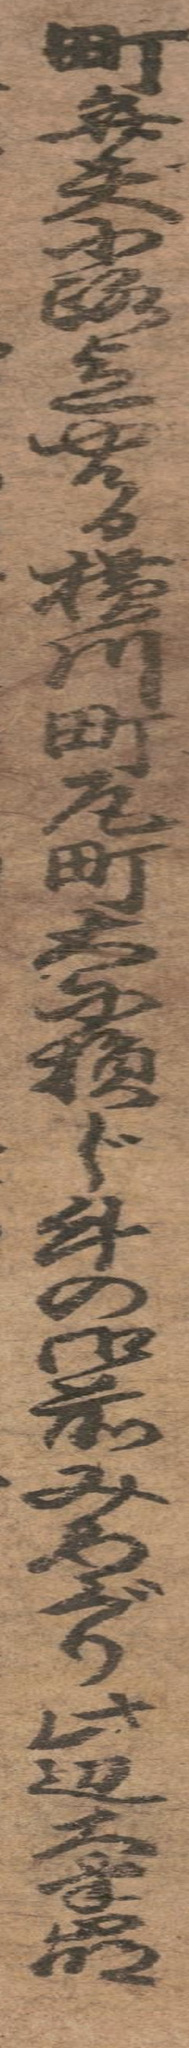町弁天小路迄やける横川町瓦町大に損じ牛の御前みつだり此辺大半崩
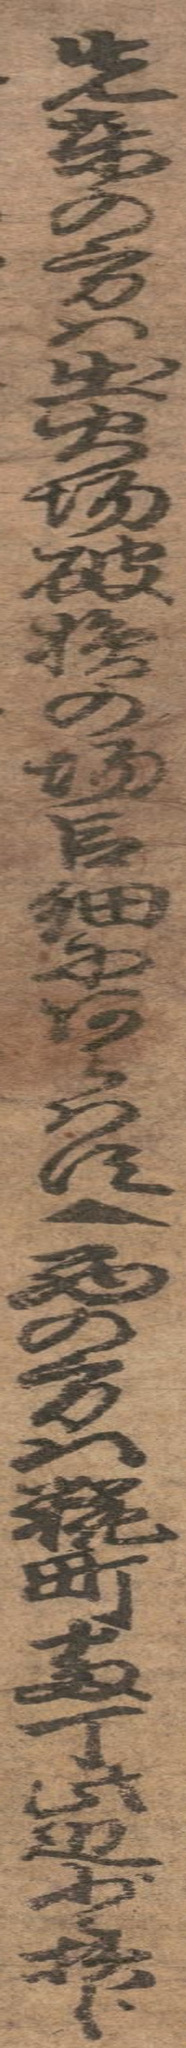先東の方ハ出火場破損の場巨細にあらハす▲西の方ハ糀町両丁此辺少々損じ
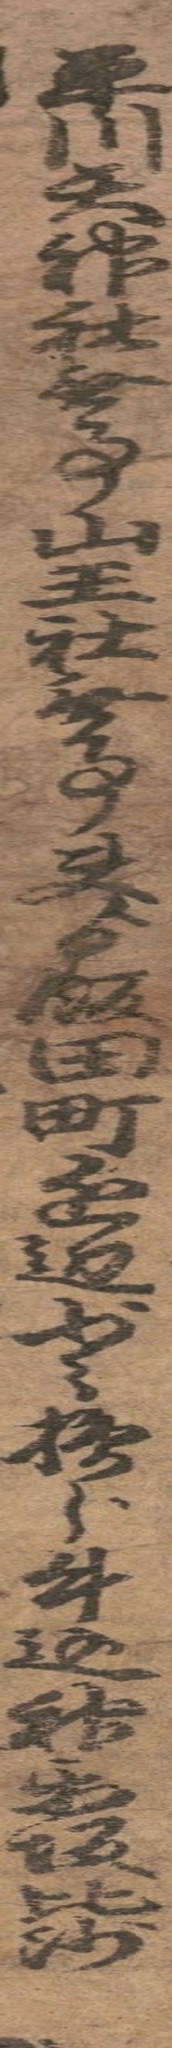平川天神社無事山王社無事夫ゟ飯田町近辺少々損じ牛込神楽坂比沙
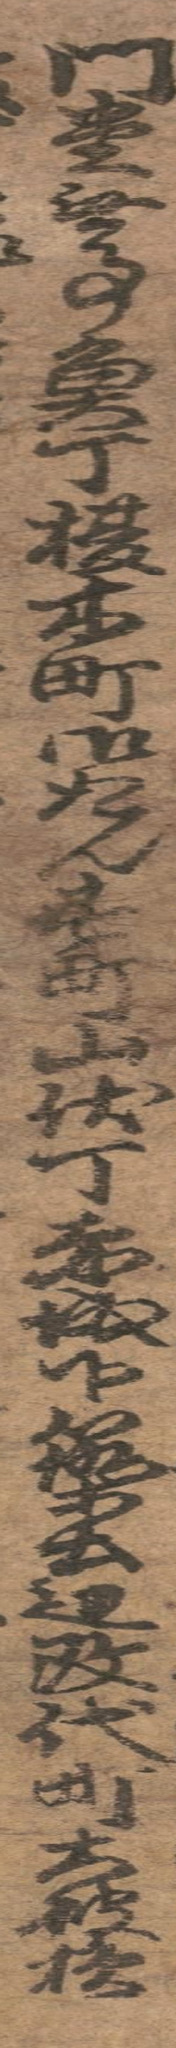門堂無事魚丁榎木丁御たんす町山伏丁赤坂下築出辺改代町大破損
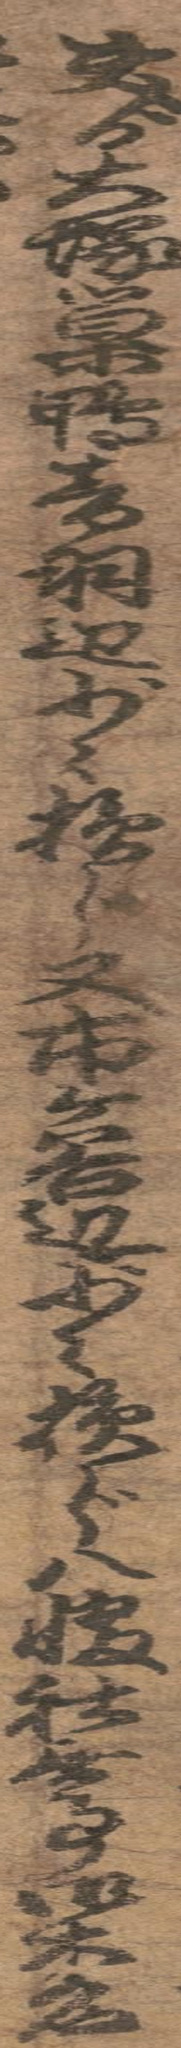夫ゟ大塚巣鴨音羽辺少々損じ又市ヶ谷辺少々損八幡社無事御大名
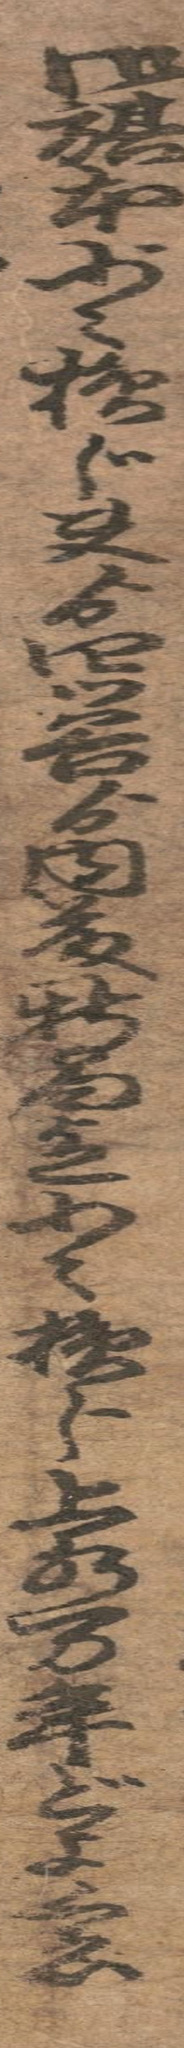御旗本少々損じ夫ゟ四ッ谷ゟ内藤新宿迄少々損じ上水万年どよくるい
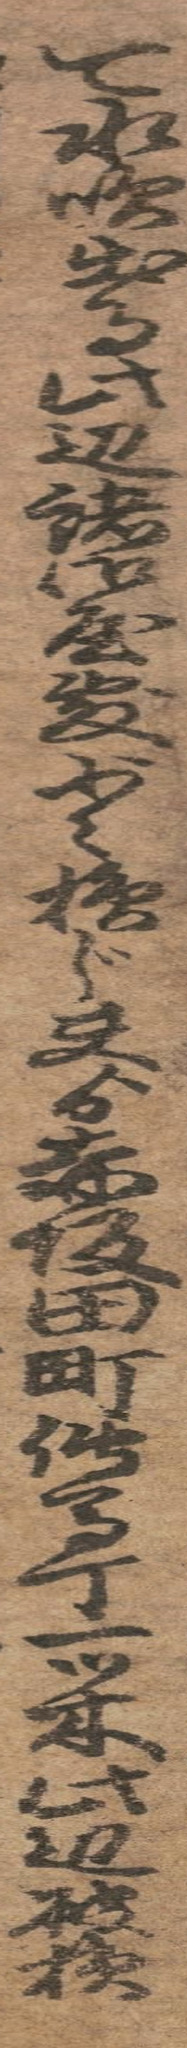て水吹出る此辺諸御屋敷少々損じ夫ゟ赤坂田町伝馬丁一ッ木此辺破損
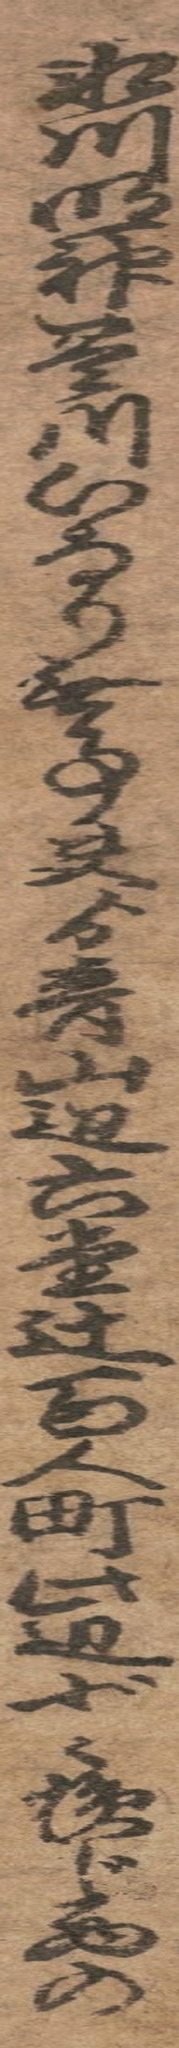氷川明神星川いなり無事夫ゟ青山辺六堂辻百人町此辺少々損じ西の
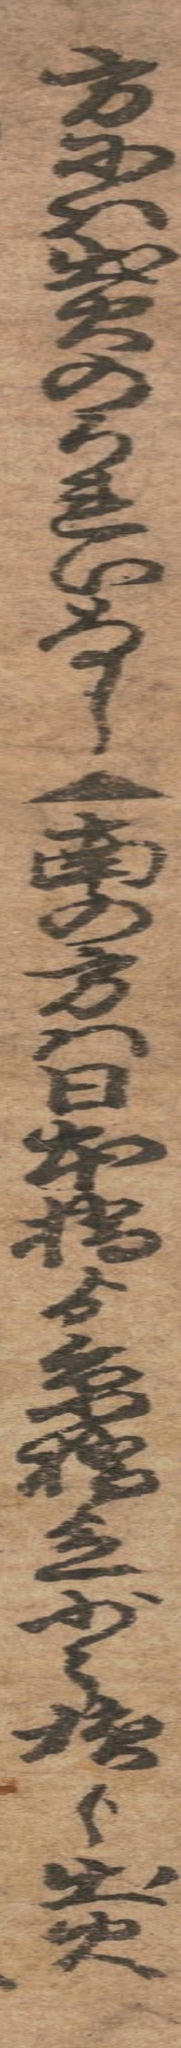方にハ出火のうれいなし▲南の方ハ日本橋ゟ京橋迄少々損じ出火
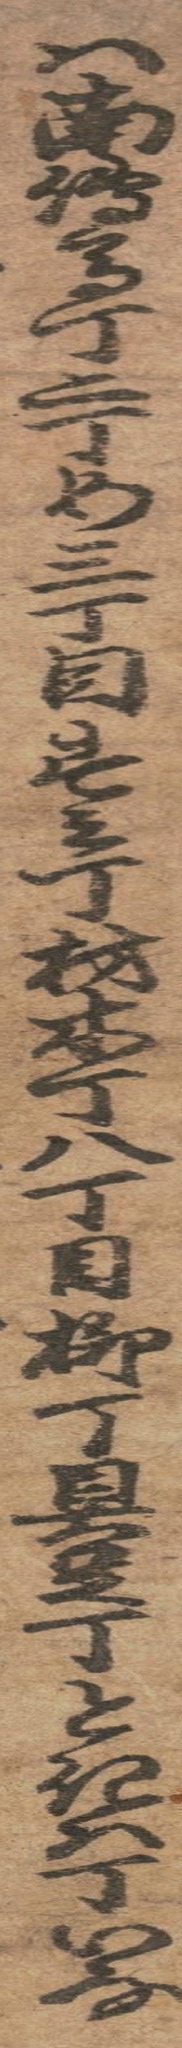ハ南伝寺丁二丁め三丁目すミ丁材木丁八丁目柳丁具足丁ときハ丁いな
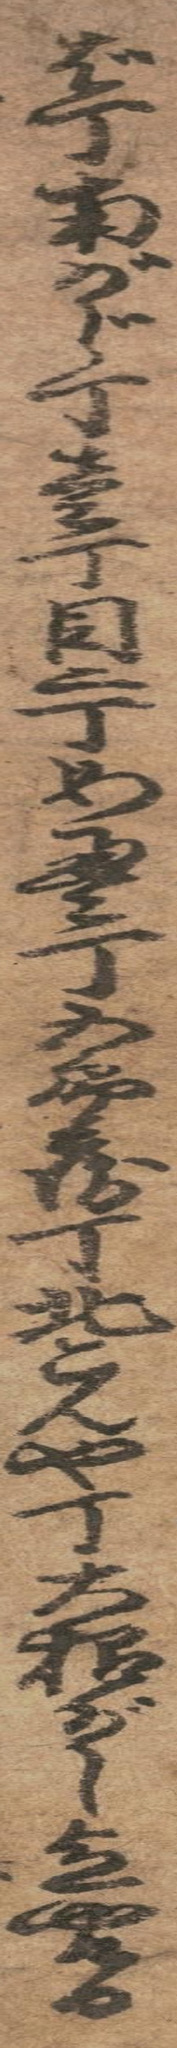ば丁南かじ丁壱丁目二丁め畳丁五郎兵衛丁北こんや丁大根がし迄やける
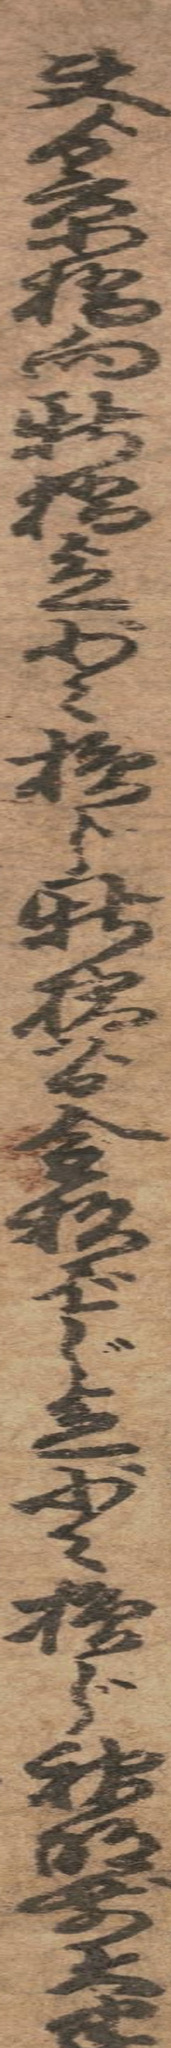夫ゟ京橋向新橋迄少々損じ新橋ゟ金杉ばし迄少々損じ神明前大半
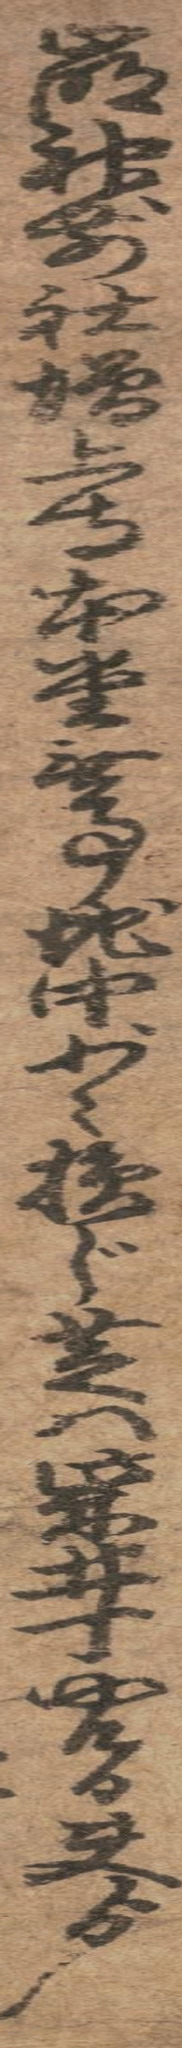崩神前社増上寺本堂無事地中少々損じ芝ハ柴井丁やける夫ゟ
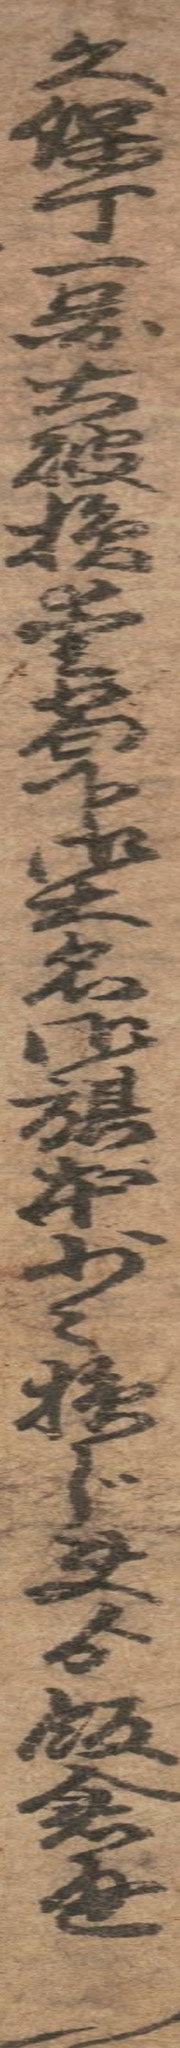久保丁一円大破損堂宿下御大名御旗本少々損じ夫ゟ飯倉通
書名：[安政江戸地震に関する瓦版]
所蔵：東京大学地震研究所図書室 Earthquake Research Institute Library, The University of Tokyo, JAPAN
